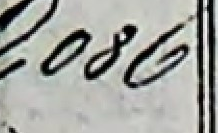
0,086
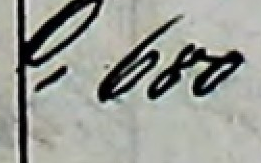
0,680
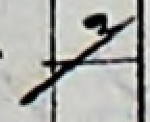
7
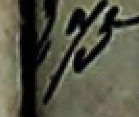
3,75
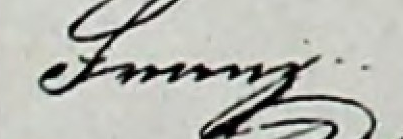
Franz
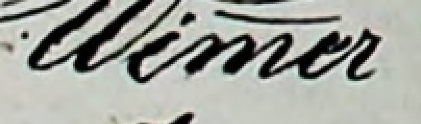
Wimmer
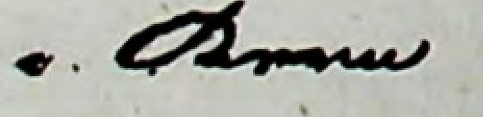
v. Krem
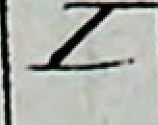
I
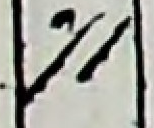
71
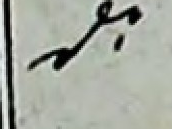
do
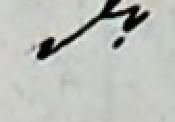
do
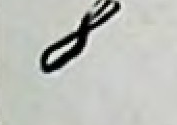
8
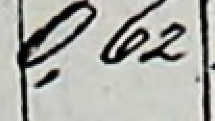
0,62
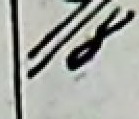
7/8
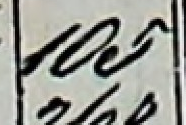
105
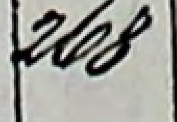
268
